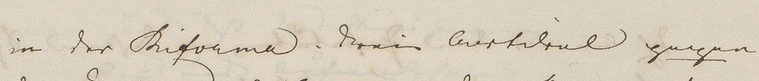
in der Riforma – drei Artikel gegen
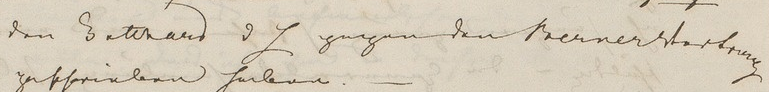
den Gotthard dh gegen den BrennerVertrag
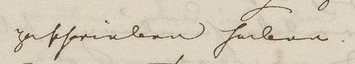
geschrieben haben. –
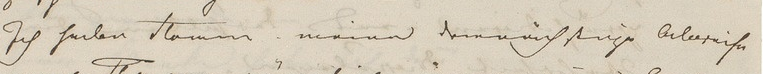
Ich habe Stamm meine demnächstige Abreise
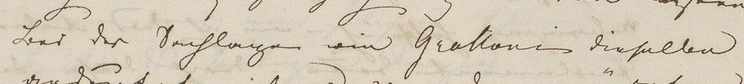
Bei der Sachlage wie Grattoni dieselbe
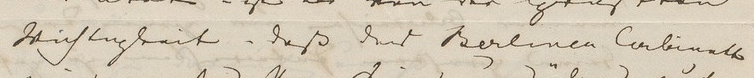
Wichtigkeit – daß das Berliner Cabinett
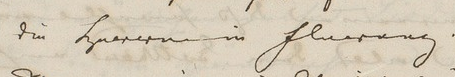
die Herrn in Florenz. –
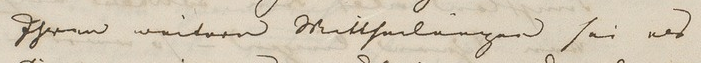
Ihren weitern Mittheilungen sei es
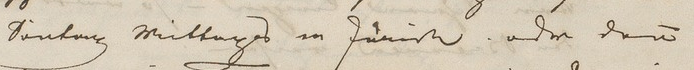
Sontag Mittags in Zürich – oder dann
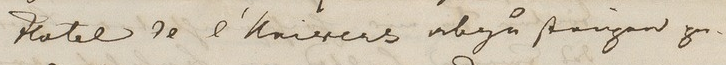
Hotel de l'Univers abzusteigen ge-
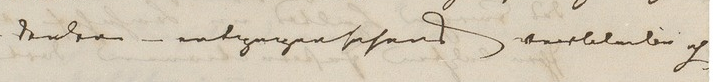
denke – entgegensehend verbleibe ich
